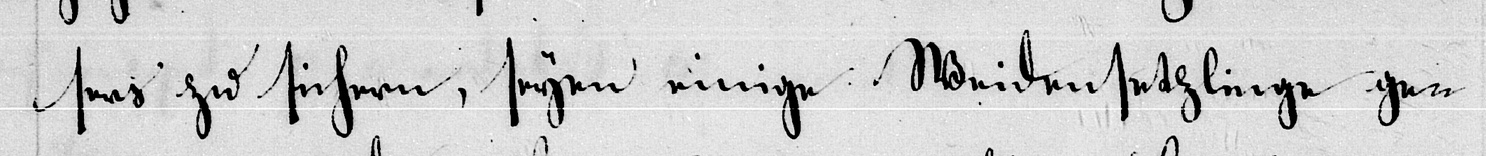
ßers zu sichern, seyen einige Weidensetzlinge ge¬
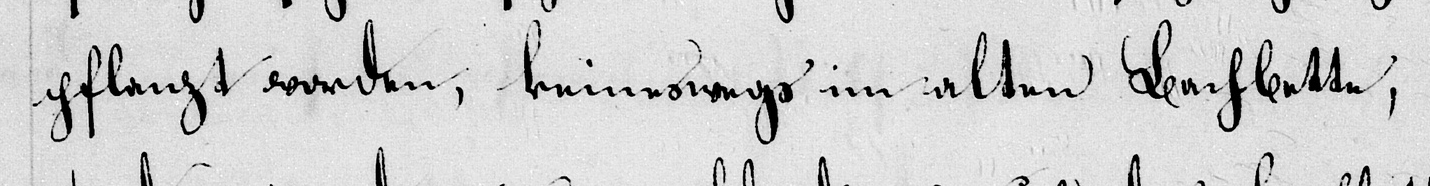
pflanzt worden, keineswegs im alten Bachbette,
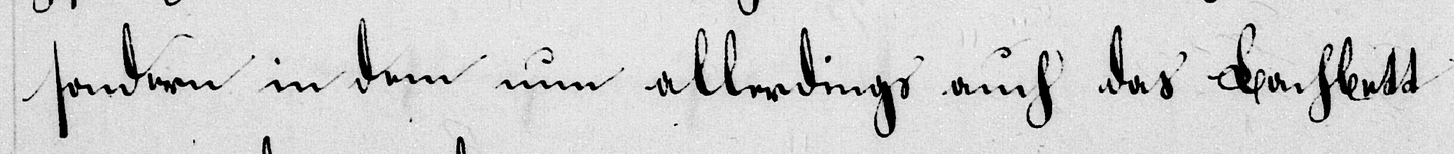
sondern in dem nun allerdings auch das Bachbett
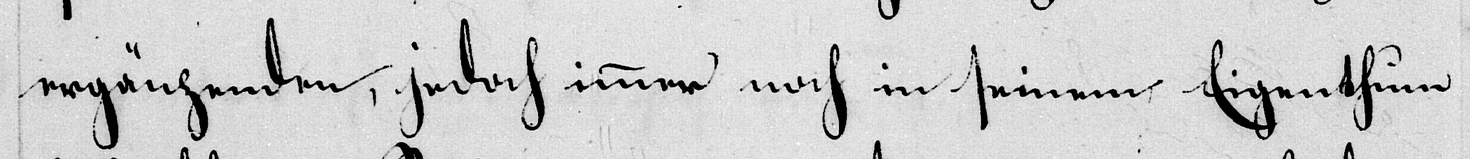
ergänzenden, jedoch immer noch in seinem Eigenthum
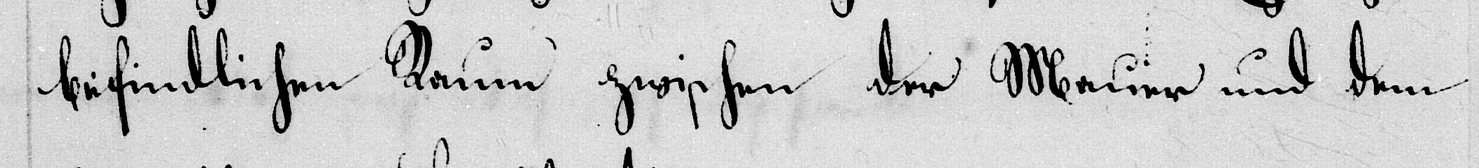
befindlichen Raum zwischen der Mauer und dem
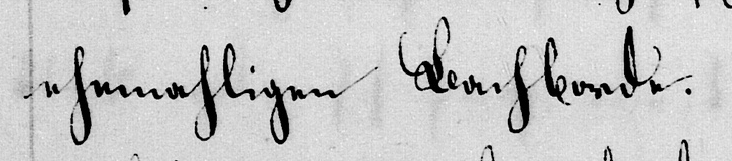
ehemahligen Bachborde.
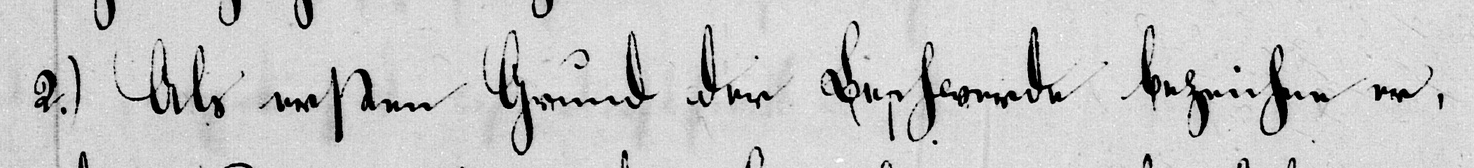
2.) Als ersten Grund der Beschwerde bezeichne er,
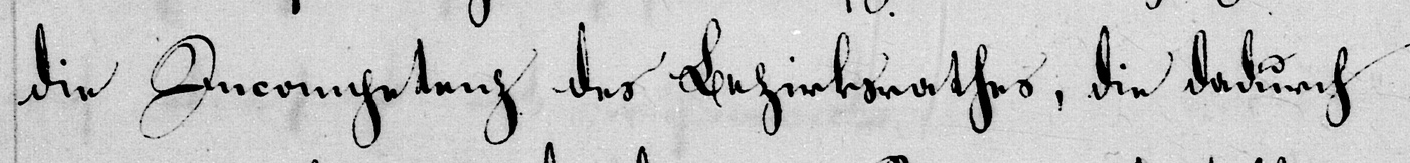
die Incompetenz des Bezirksrathes, die dadurch
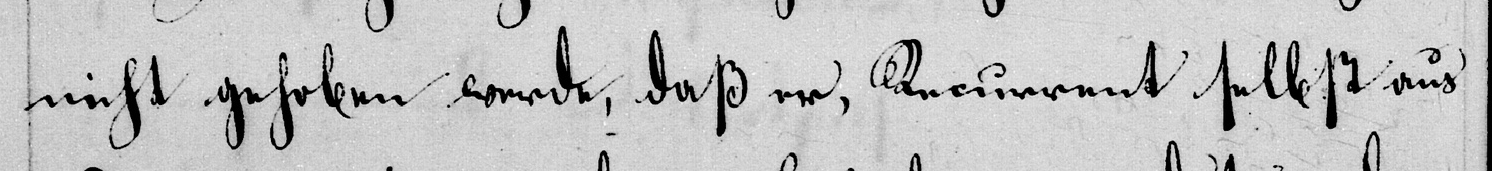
nicht gehoben werde, daß er, Recurrent selbst aus
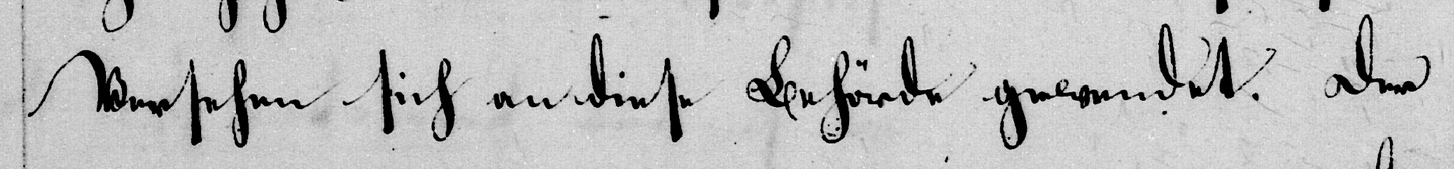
Versehen sich an diese Behörde gewendet. Der
